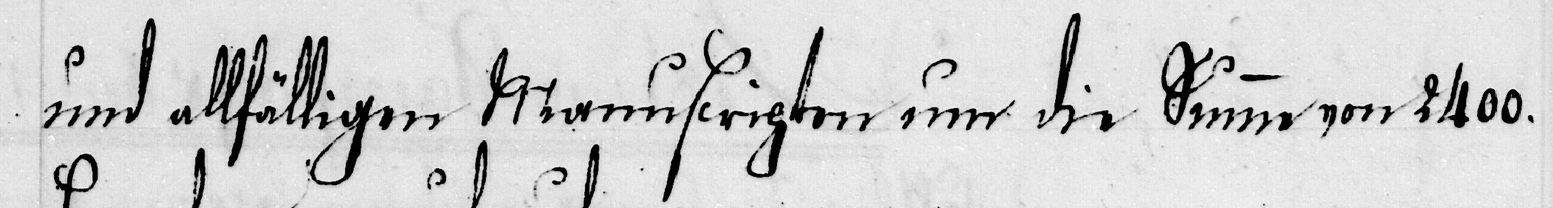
und allfälligen Manuscripten um die Summe von 2400.
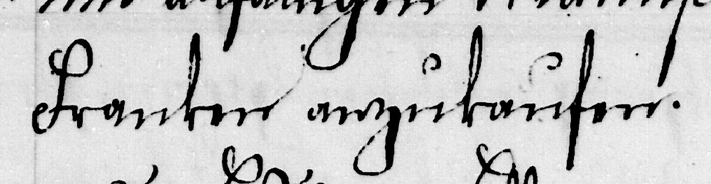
Franken anzukaufen.
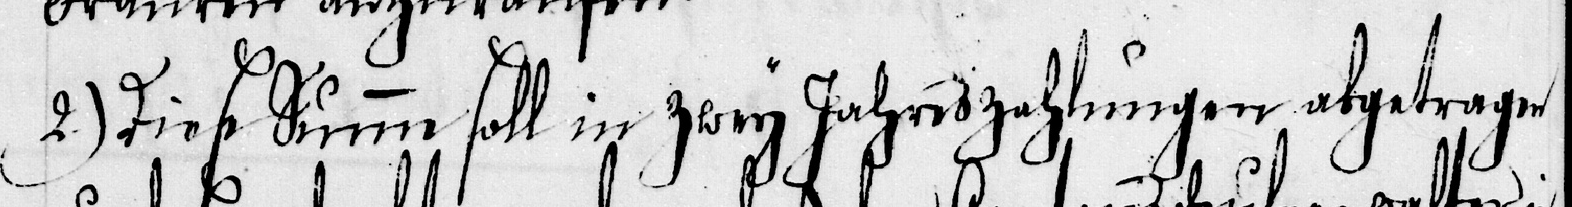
2.) Diese Summe soll in zwey Jahreszahlungen abgetragen
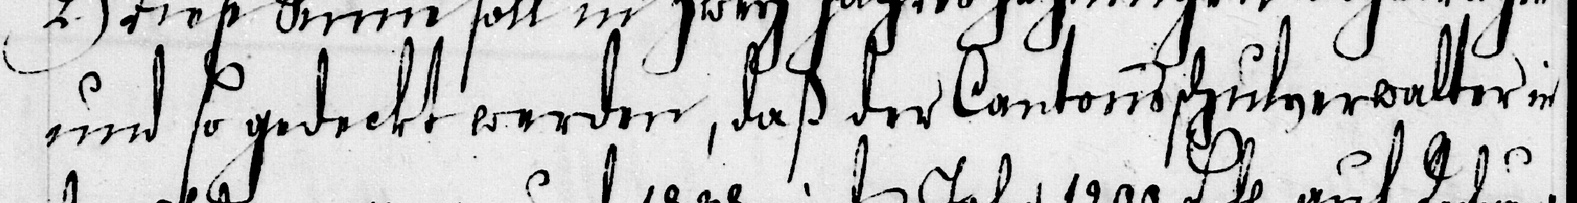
und so gedeckt werden, daß der Cantonsschulverwalter in
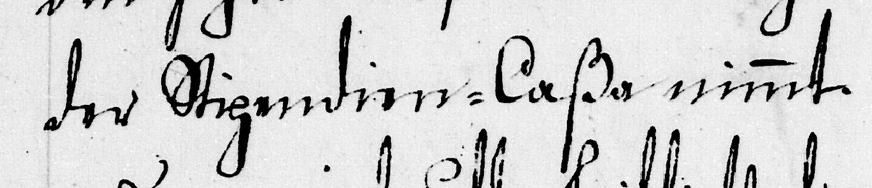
der Stipendien-Caßa nimmt.
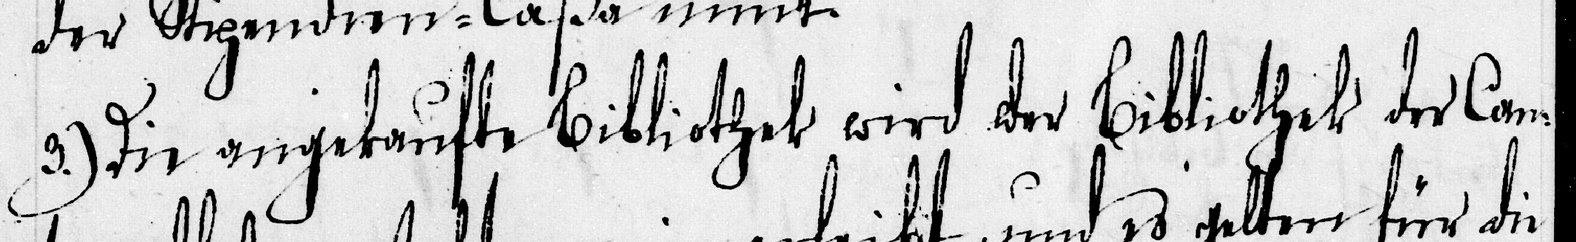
3.) Die angekaufte Bibliothek wird der Bibliothek der Can¬
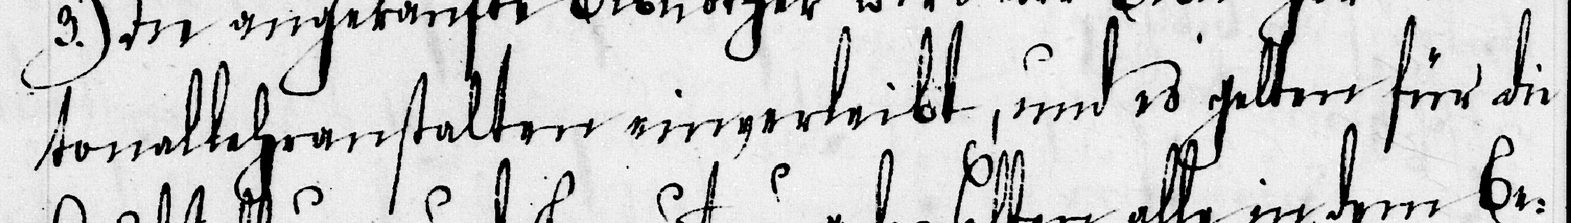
tonallehranstalten einverleibt, und es gelten für die
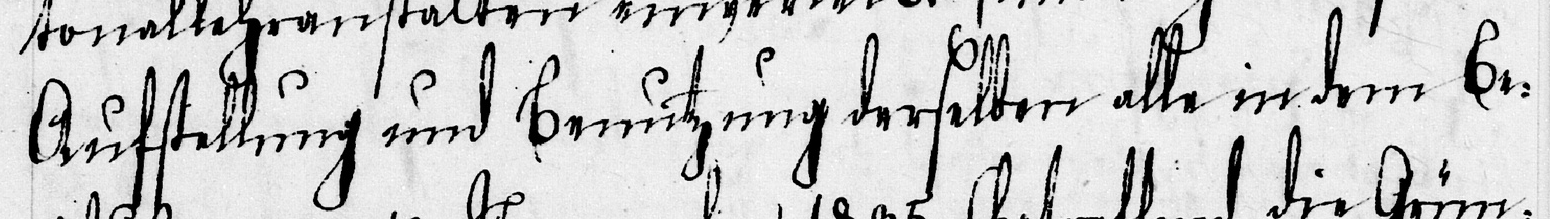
Aufstellung und Benutzung derselben alle in dem Be¬
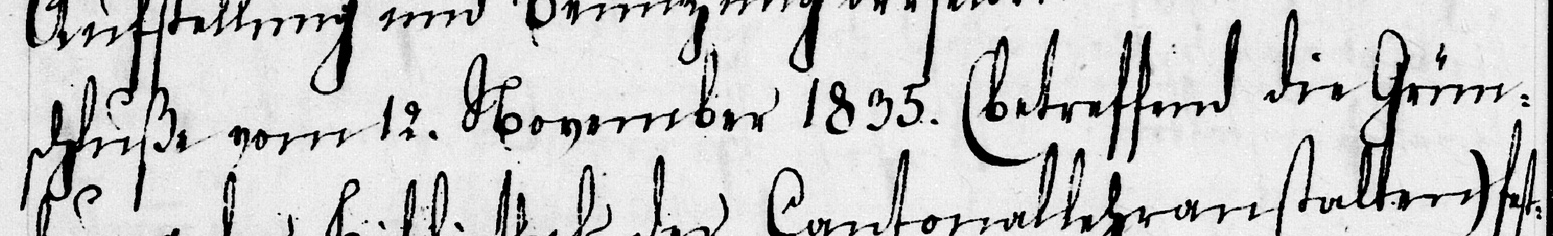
schluße vom 12. November 1835. (betreffend die Grün¬
